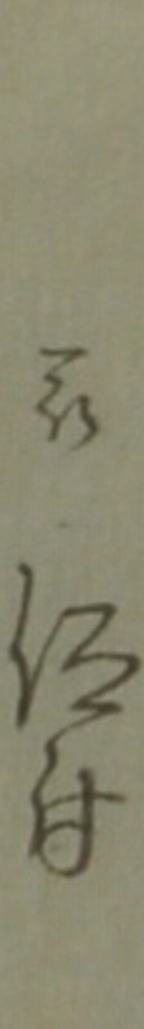被仰付
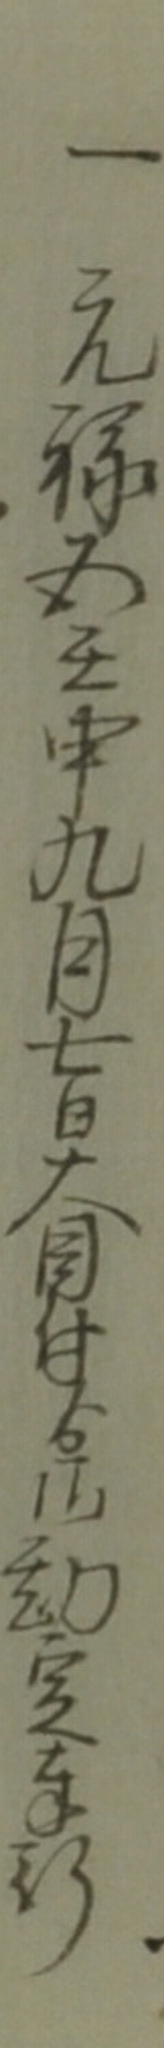一元禄五壬申九月七日大目付ゟ御勘定奉行
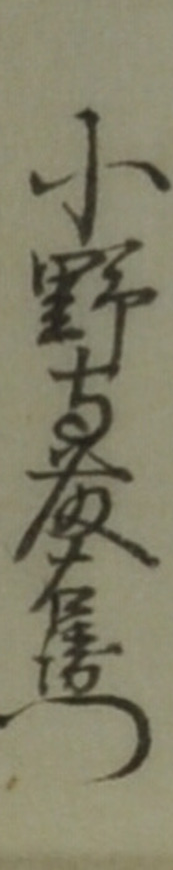小野寺藤右衛門
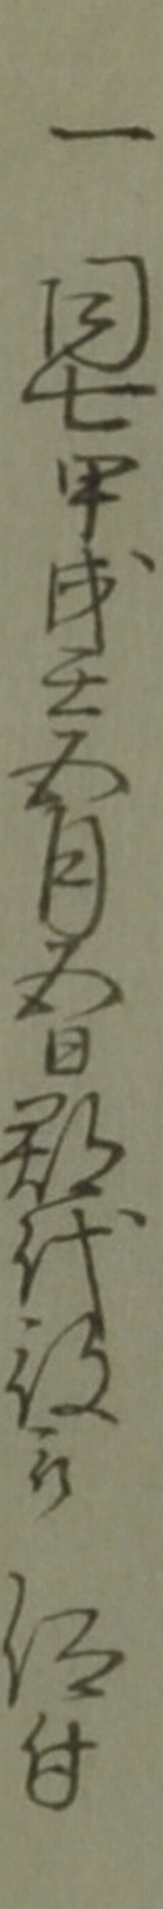一同七甲戌閏五月五日郡代役被仰付
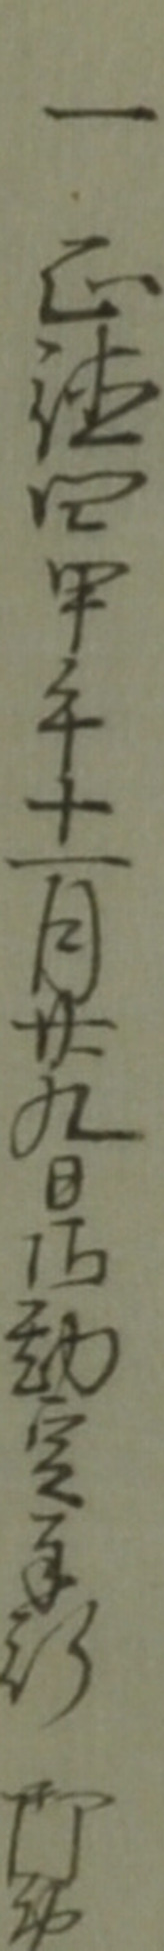一正徳四甲午十一月廿九日御勘定奉行御免
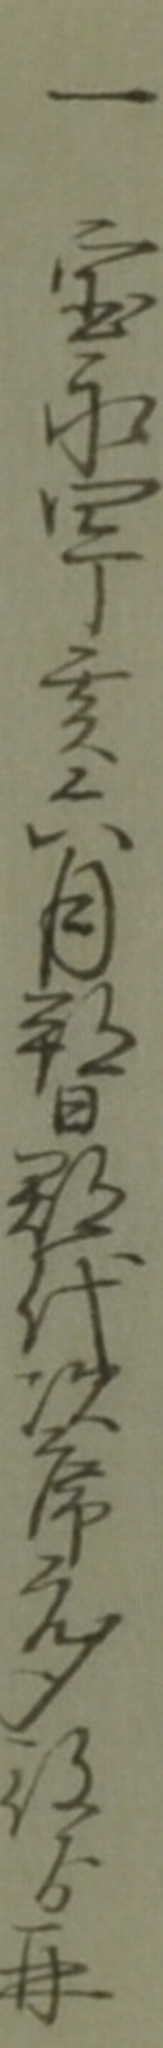一宝永四丁亥六月朔日郡代次席元〆役ゟ再
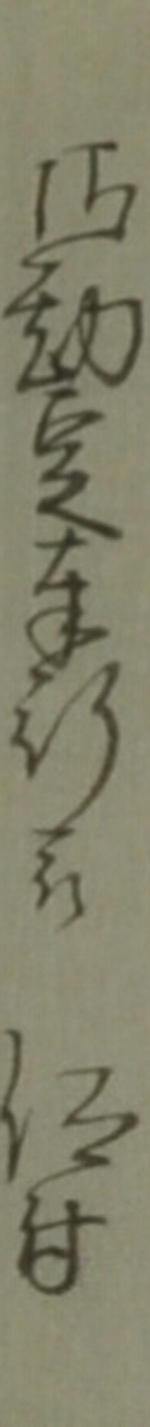御勘定奉行被仰付
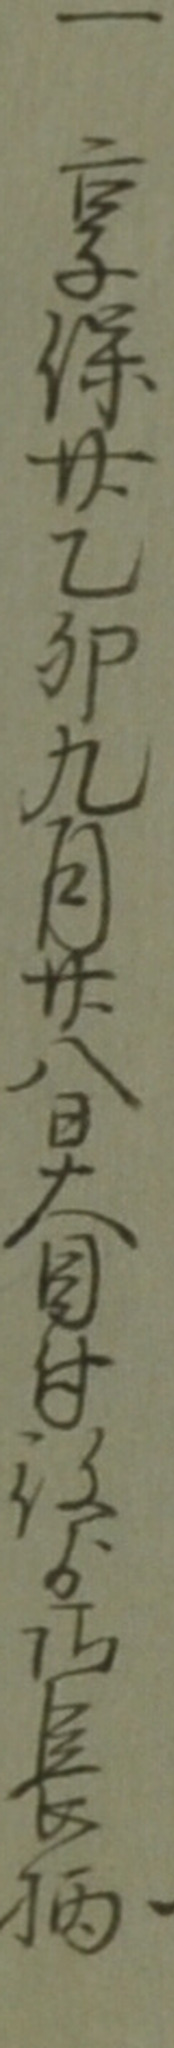一享保廿乙卯九月廿八日大目付役ゟ御長柄
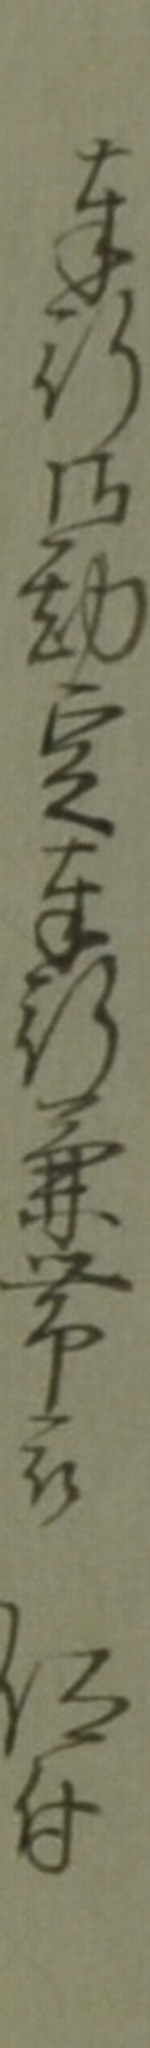奉行御勘定奉行兼帯被仰付
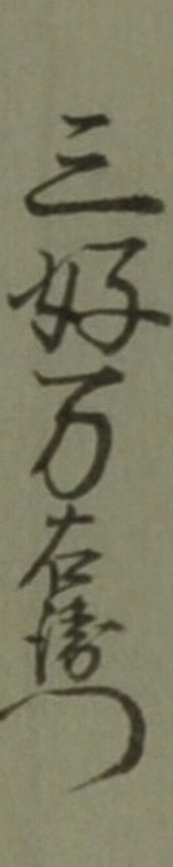三好万右衛門
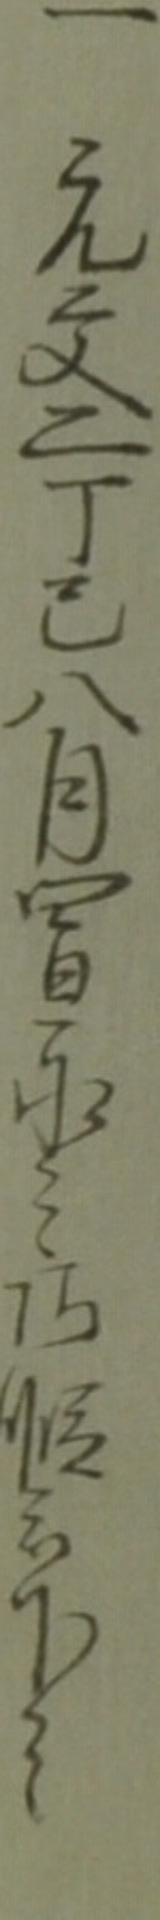一元文二丁巳八月四日永之御暇被下之
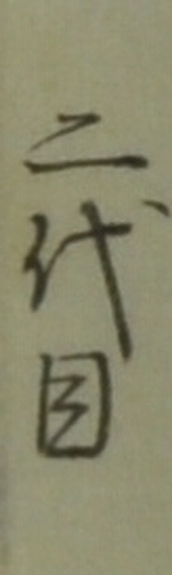二代目

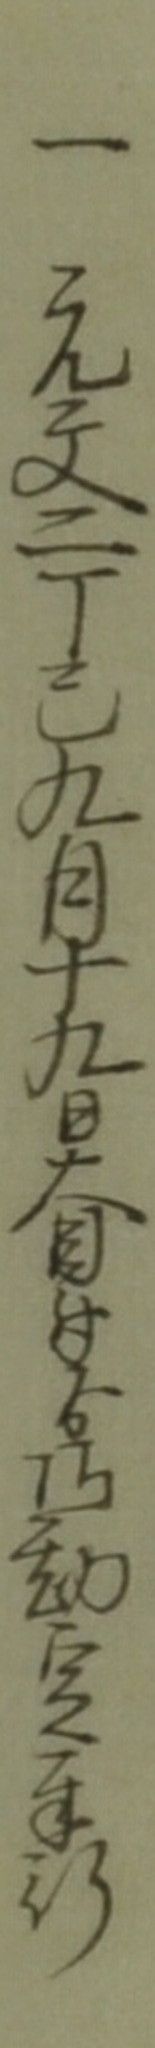一元文二丁巳九月十九日大目付ゟ御勘定奉行
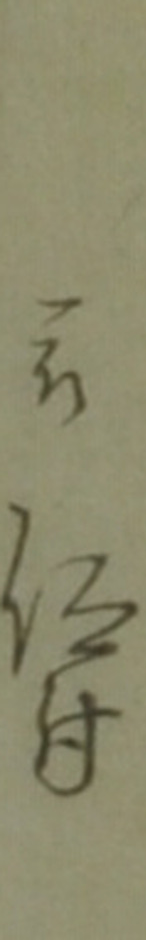被仰付
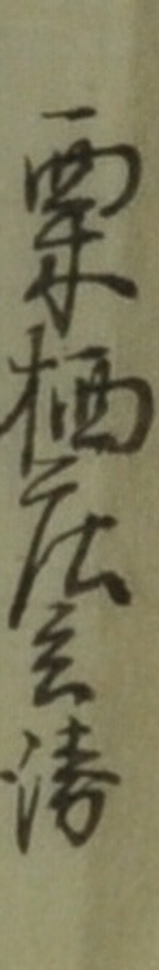栗栖庄兵衛
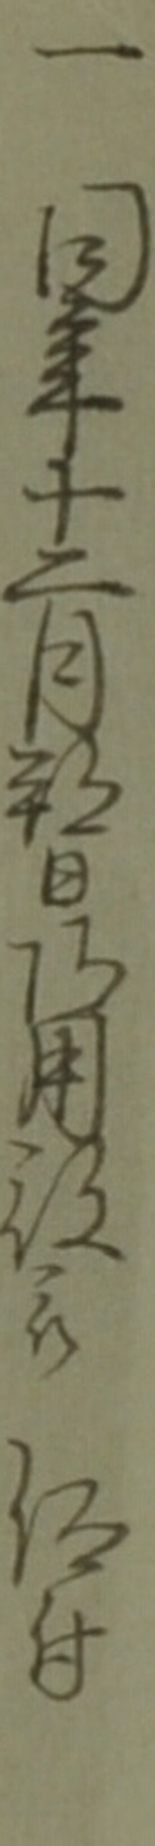一同年十二月朔日御用役被仰付
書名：諸御役代々録（三）
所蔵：伊那市立高遠町図書館・合同会社AMANE
